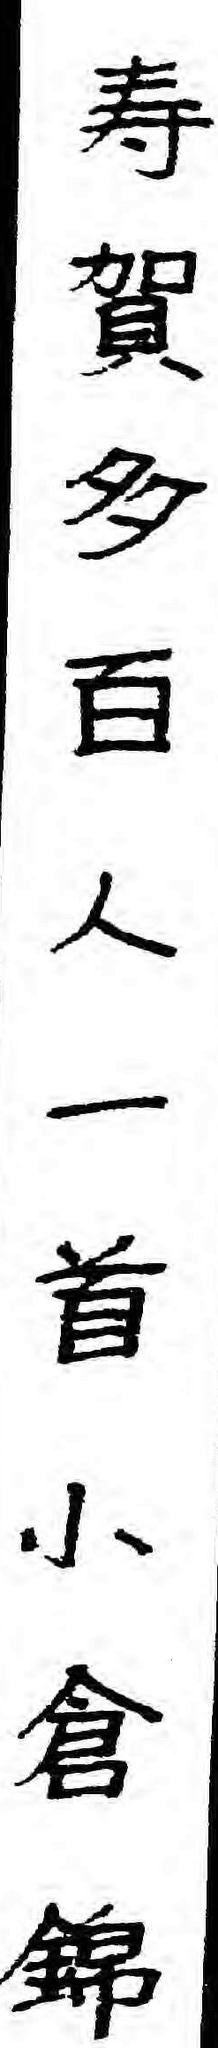寿賀多百人一首小倉錦
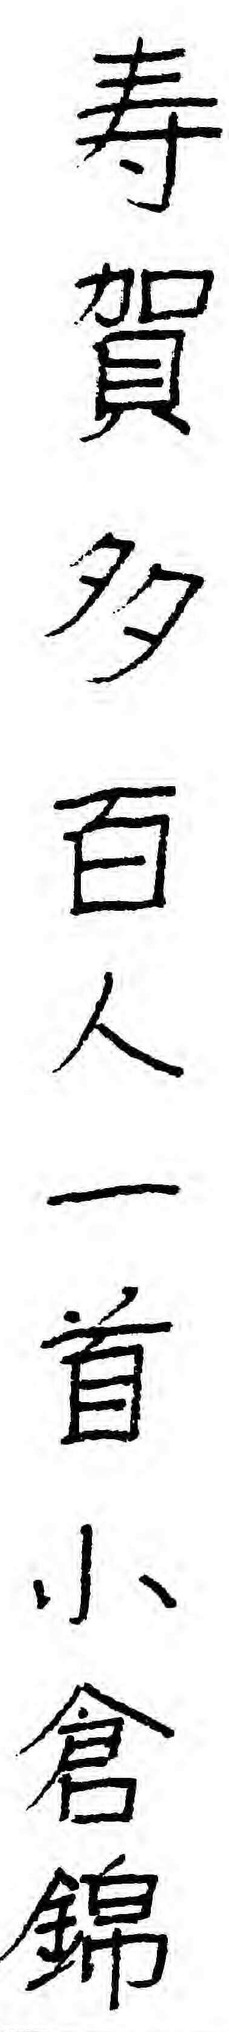寿賀多百人一首小倉錦

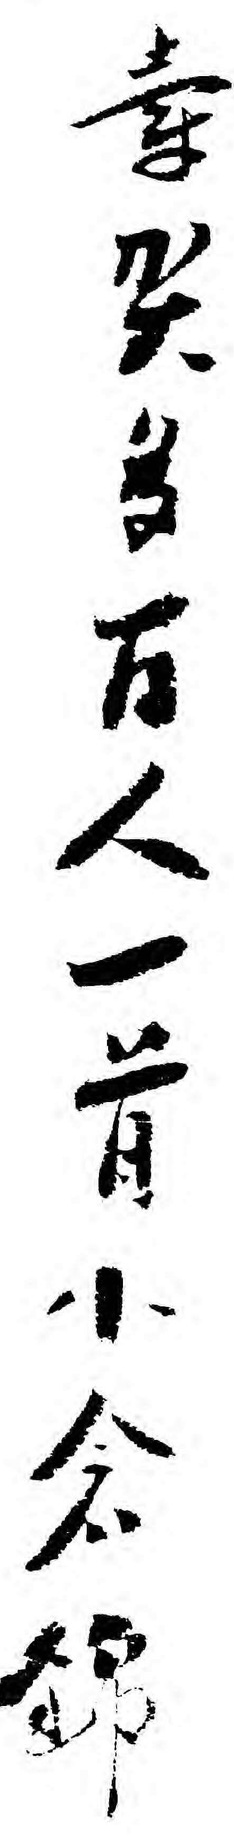寿賀多百人一首小倉錦

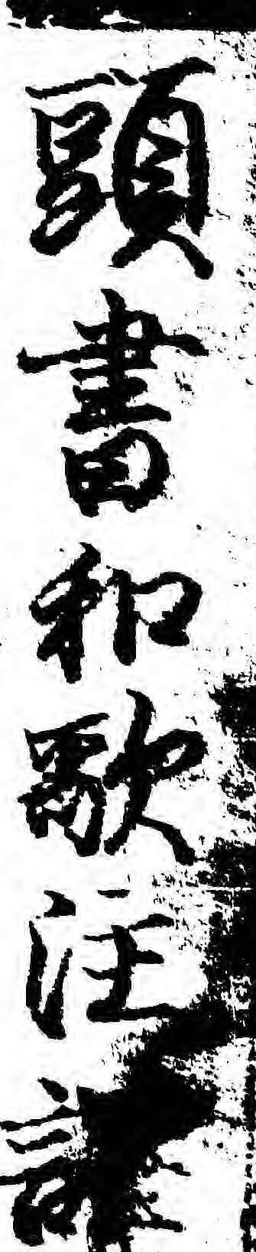頭書和歌注訳
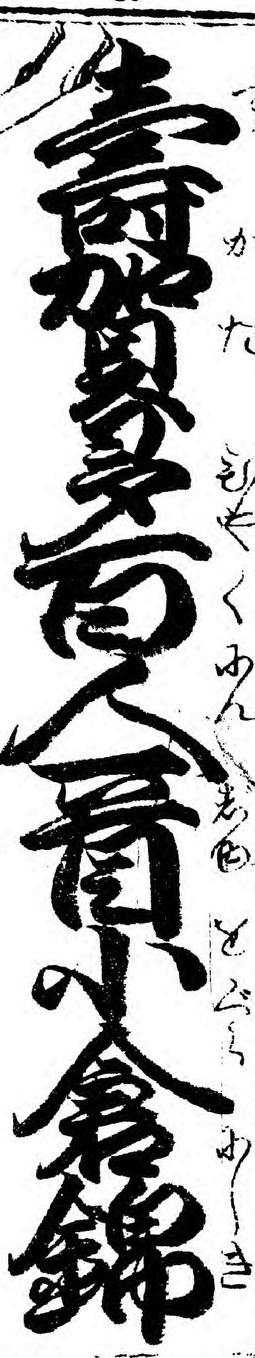寿賀多百人一首小倉錦
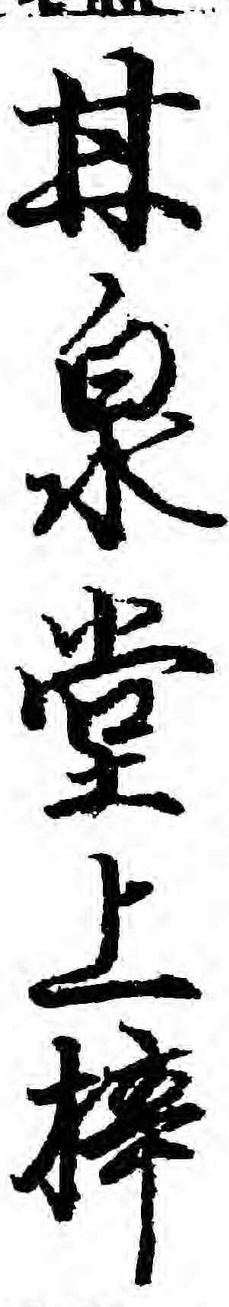甘泉堂上梓
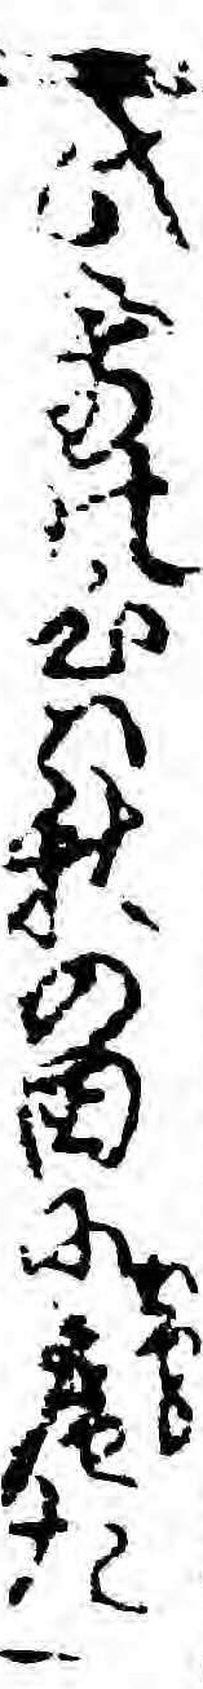此哥の心は秋の田に庵た
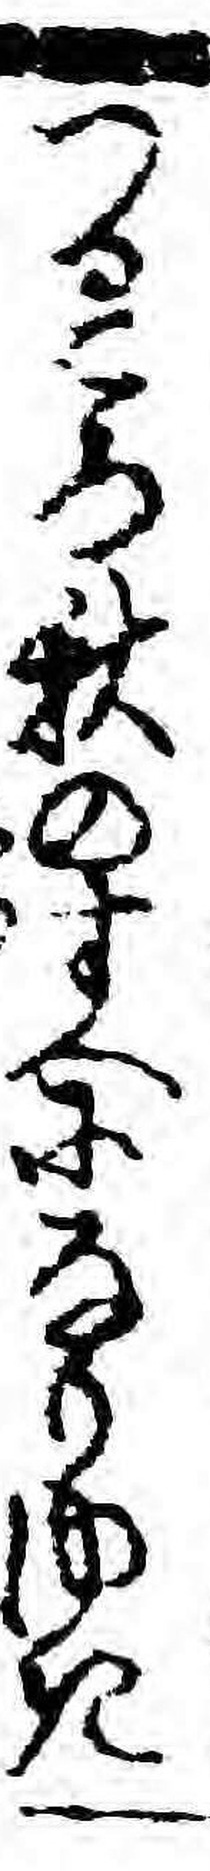つるころ秋のすへになりゆき
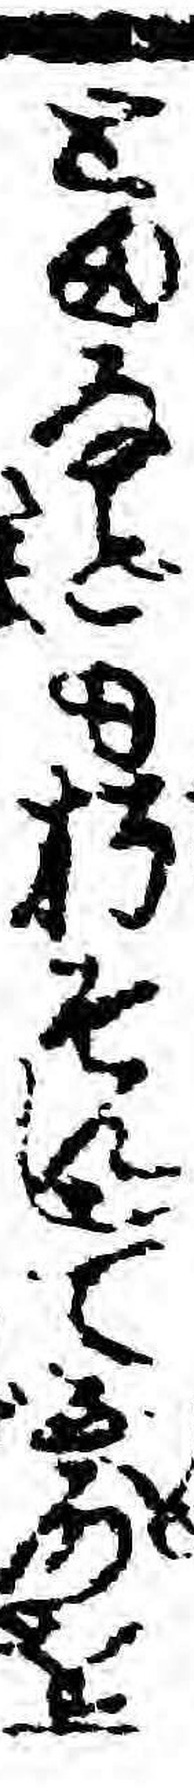とまなども朽そんじて露を
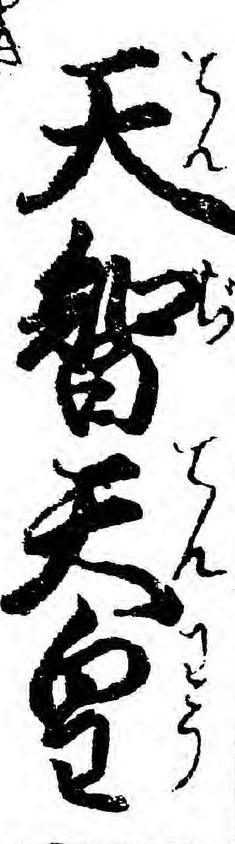天智天皇
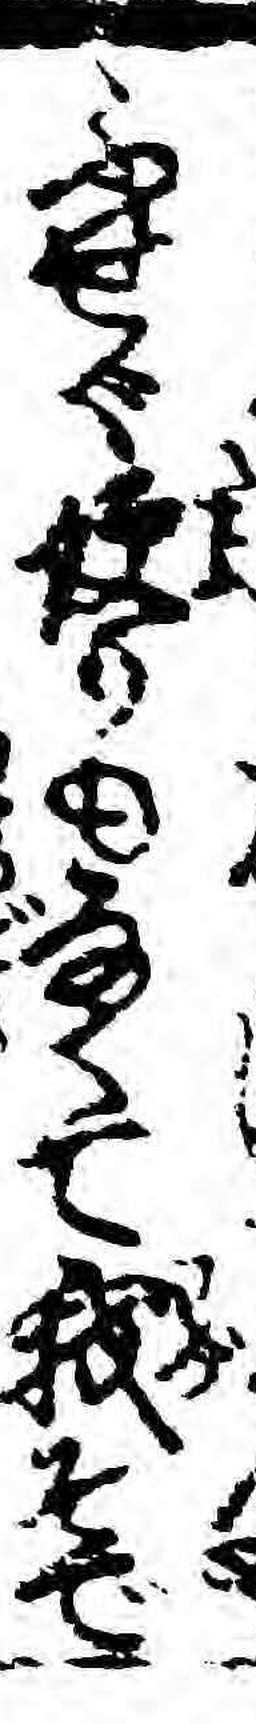ふせぐ便りもなくて我そで
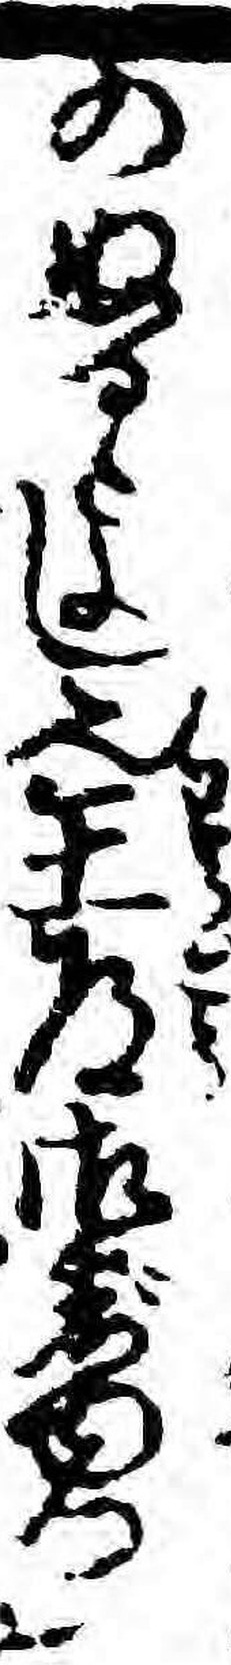のぬるゝよし也王道御じゆつ
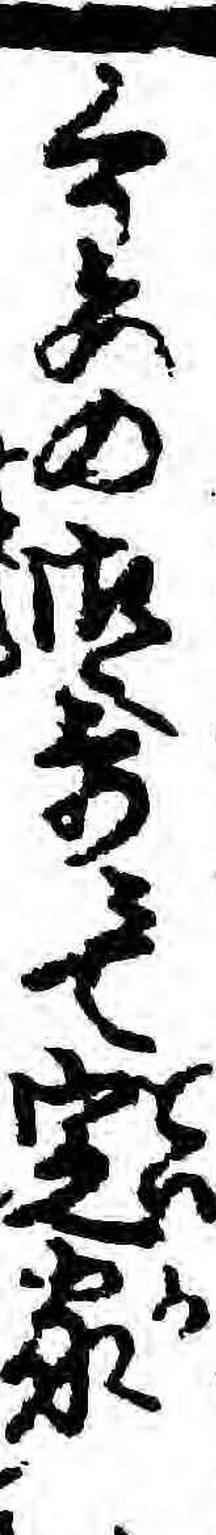くわいの御哥にて定家
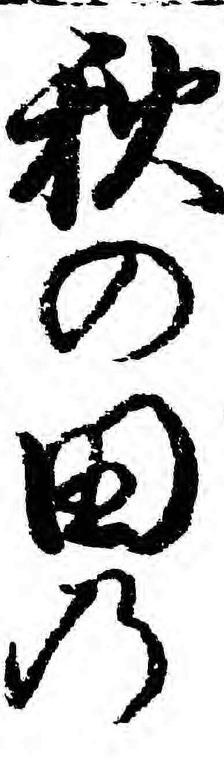秋の田の
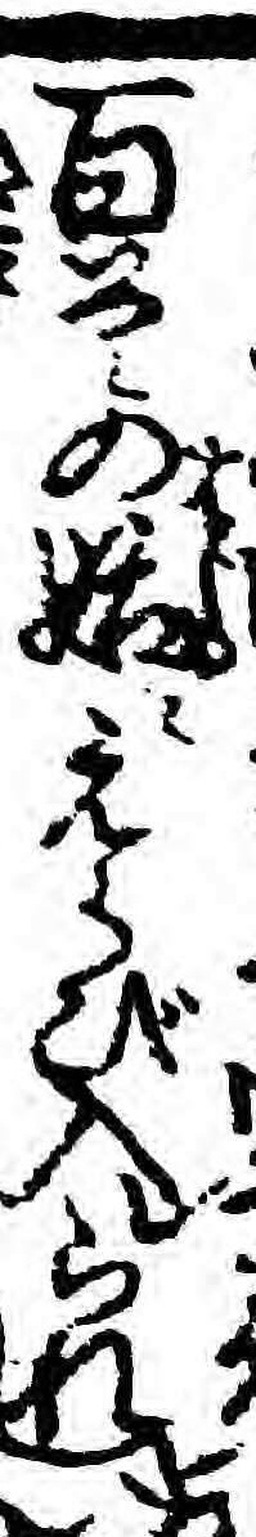百首の始にえらび入れられし
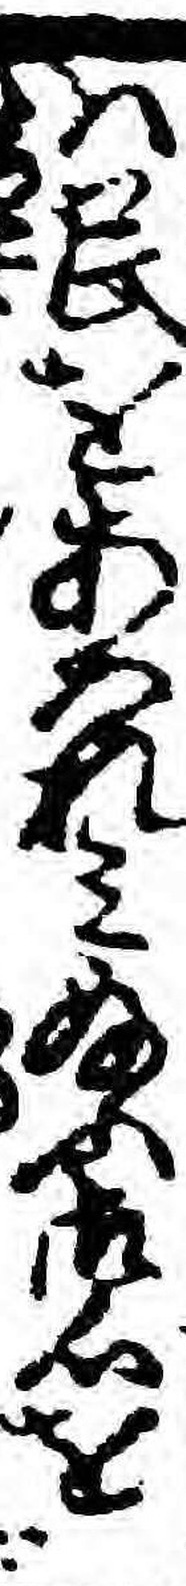は民をあはれみ給ふ御心を
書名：頭書和歌注譯／壽賀多百人一首小倉錦
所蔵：国文学研究資料館
